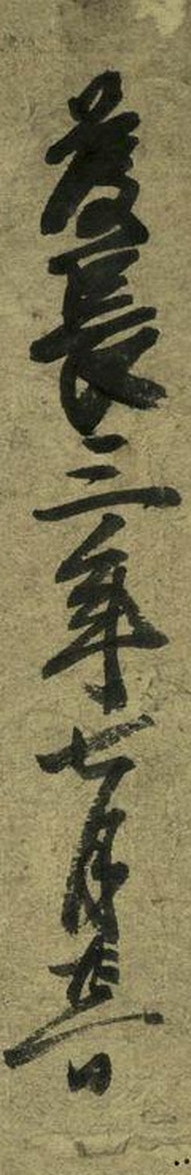「慶長三年七月廿一日
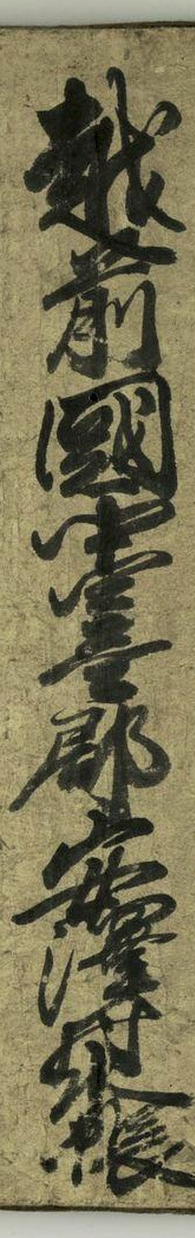越前国中墨郡安沢村水帳
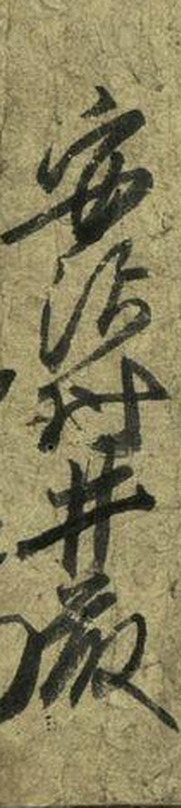安沢村井藤

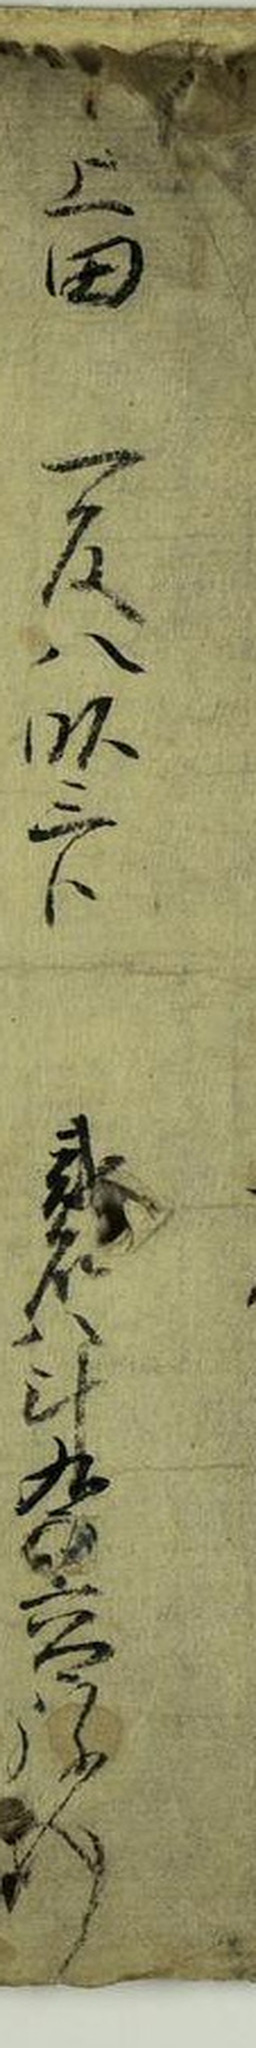上田一反八畝三歩弐石八斗九升六合弥介
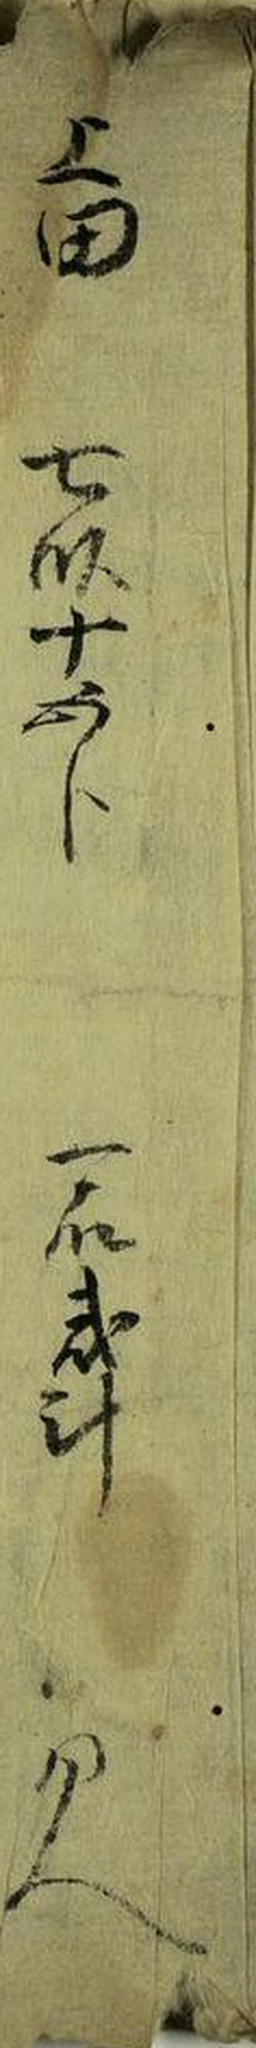上田七畝十五歩一石弐斗同人
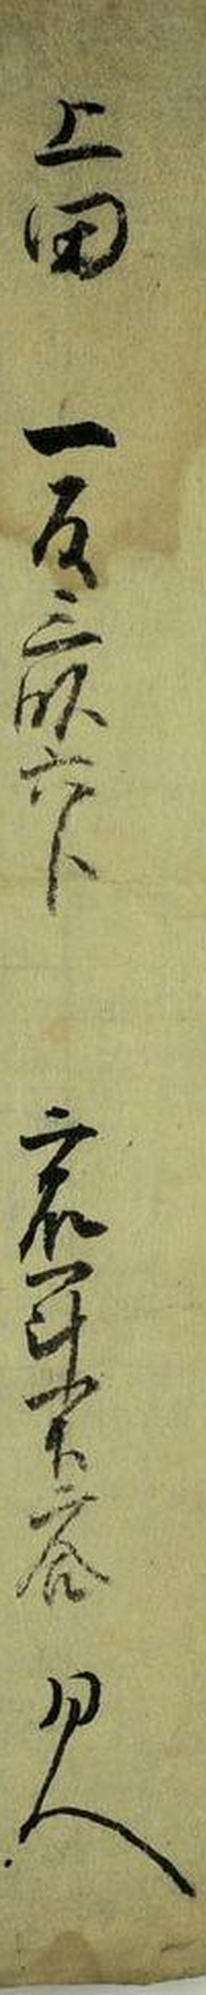上田一反三畝六歩二石一斗一升二合同人
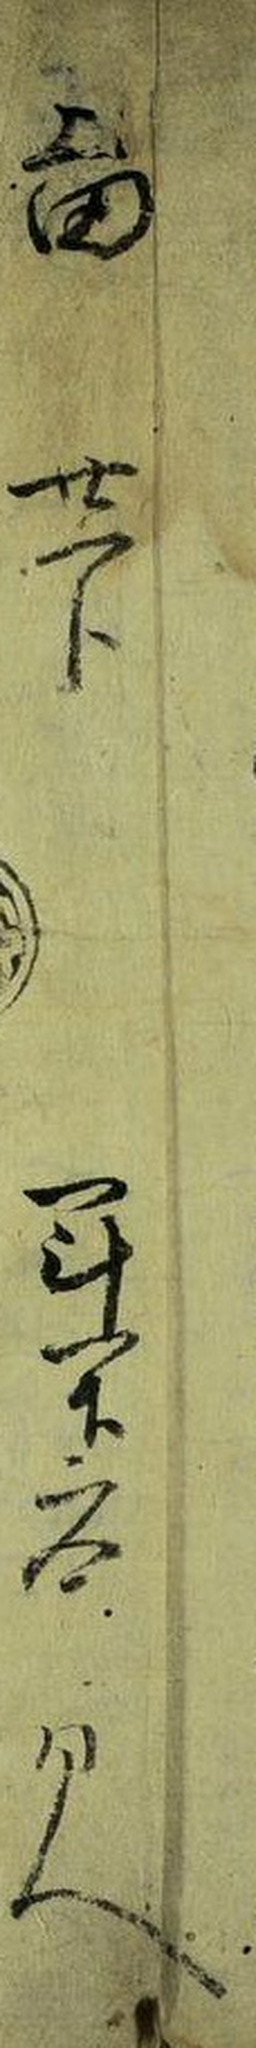上田廿一歩一斗一升二合同人
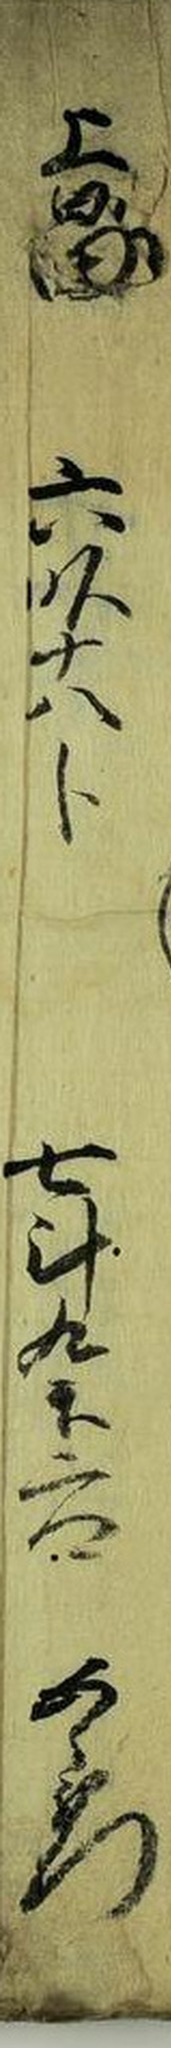上畠六畝十八歩七斗九升二合五郎右衛門
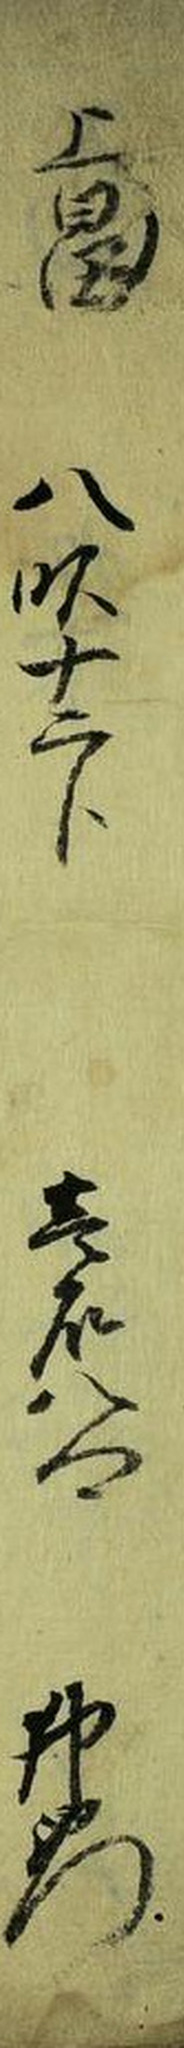上畠八畝十二歩一石八合仲右衛門
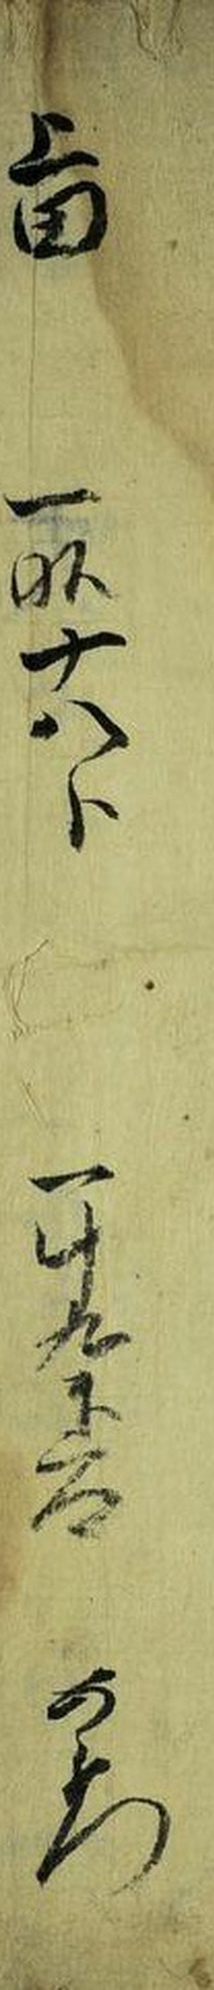上田一畝十八歩一斗九升二合五右衛門

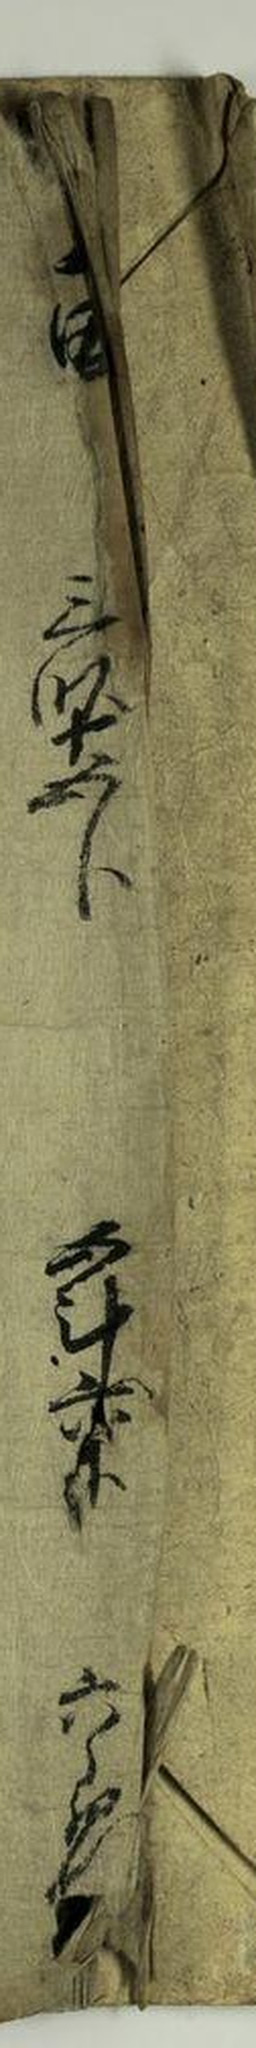上田三畝十五歩五斗六升六郎
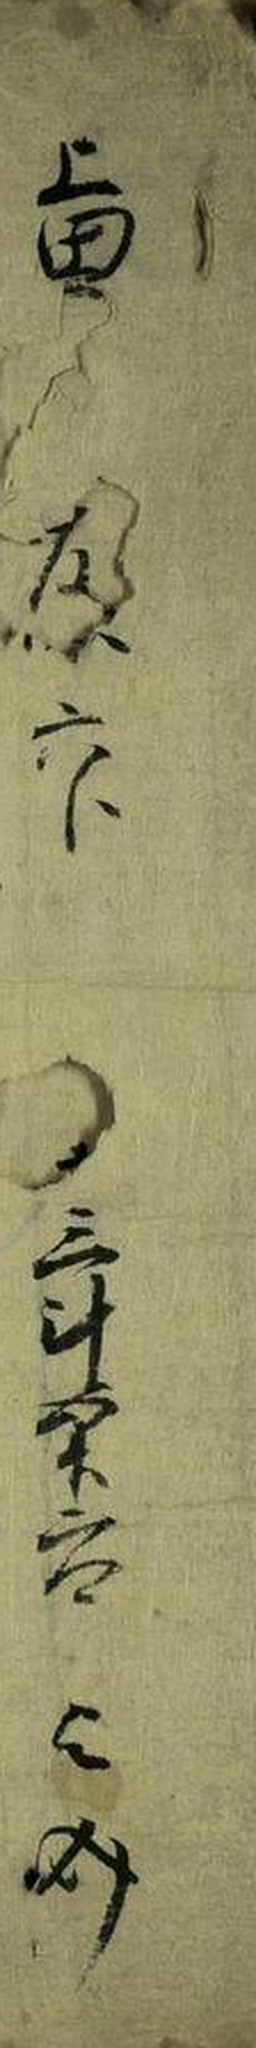上田六歩三斗五升二合与介
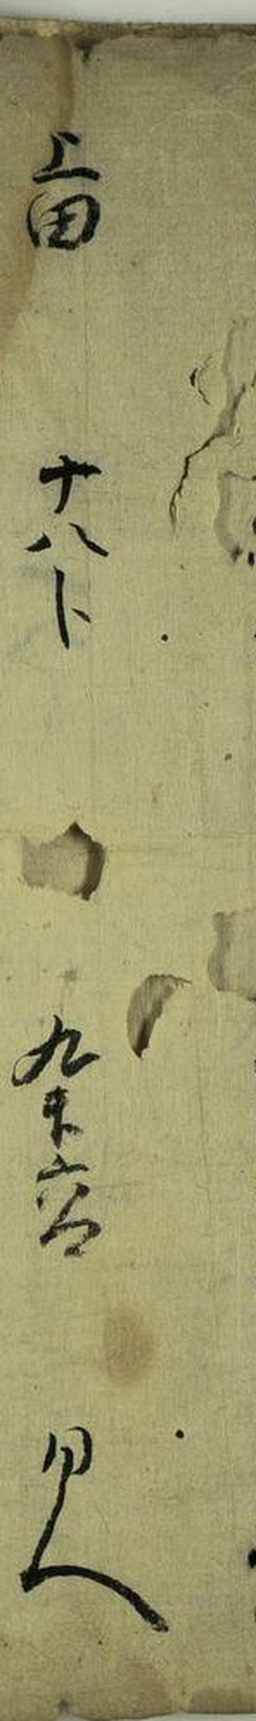上田十八歩九升六合同人
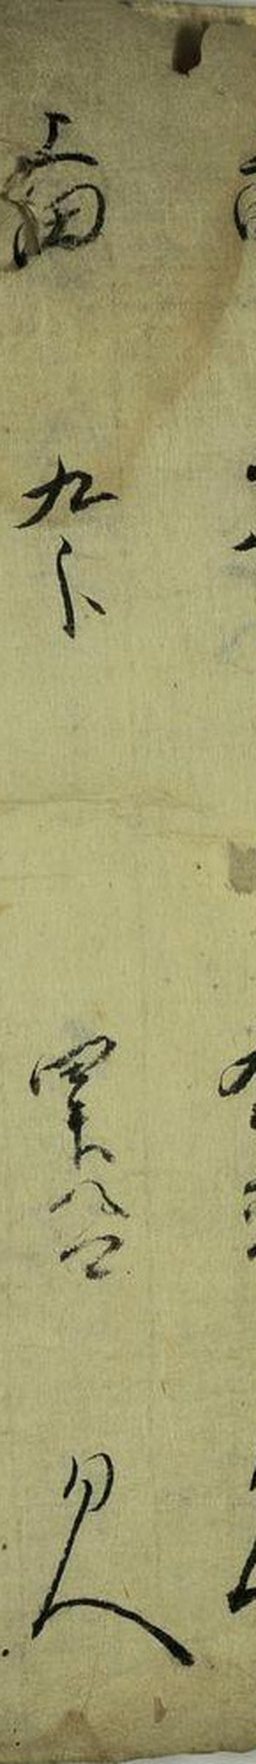上田九歩四升八合同人
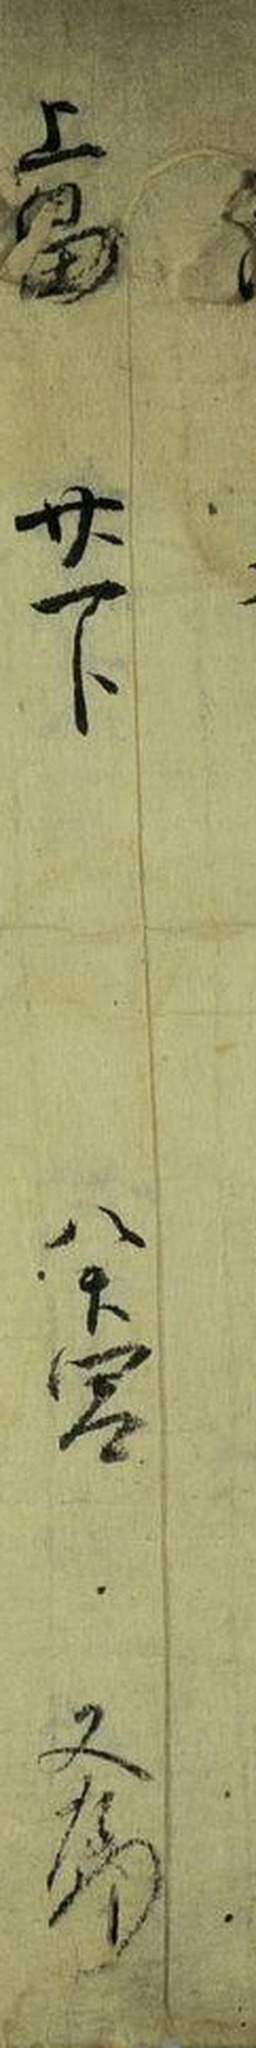上畠廿一歩八升四合又左衛門尉
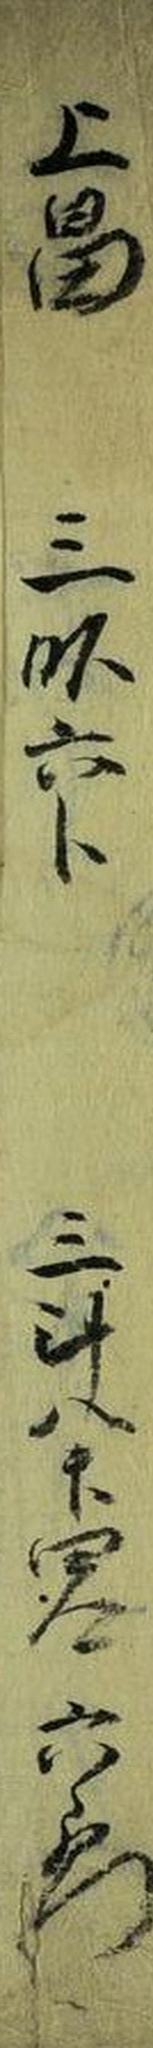上畠三畝六歩三斗八升四合六郎右衛門
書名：越前国中墨郡安沢村水帳（太閤検地帳）
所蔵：福井県文書館 Fukui Prefectural Archives
